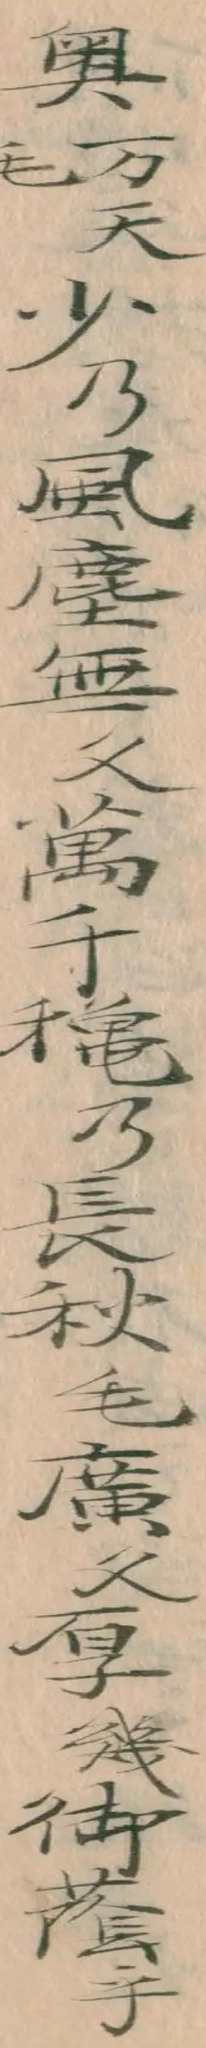奥万天毛少乃風塵無久萬千穐乃長秋毛廣久厚幾御蔭乎
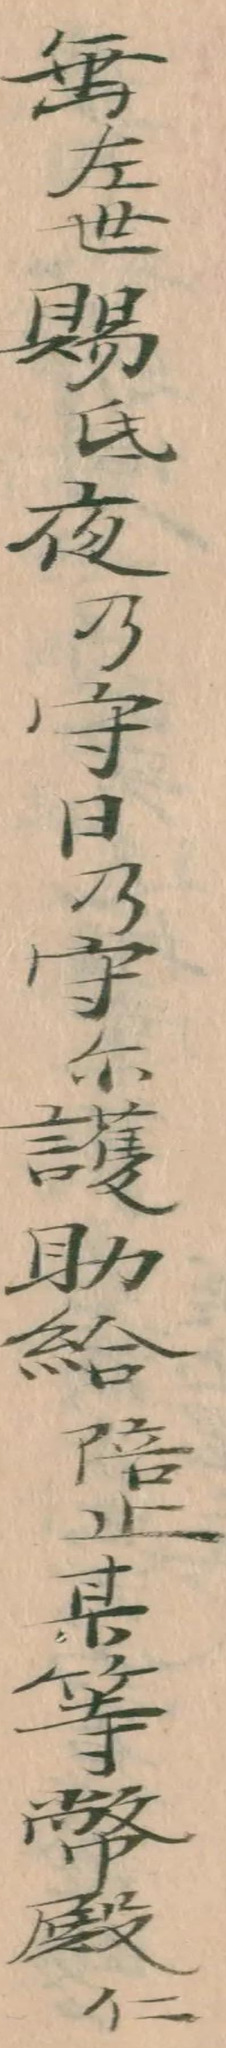垂左世賜氐夜乃守日乃守尓護助給陪止某等幣殿仁
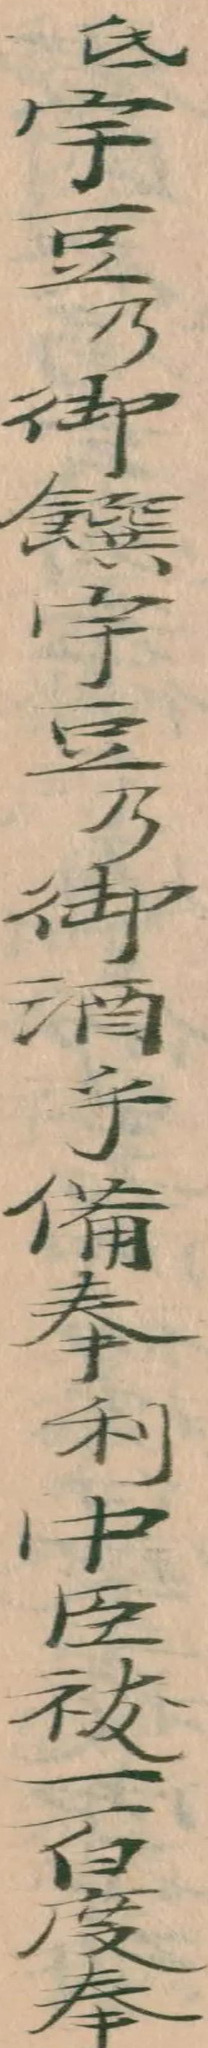氐宇豆乃御饌宇豆乃御酒乎備奉利中臣被一百度奉
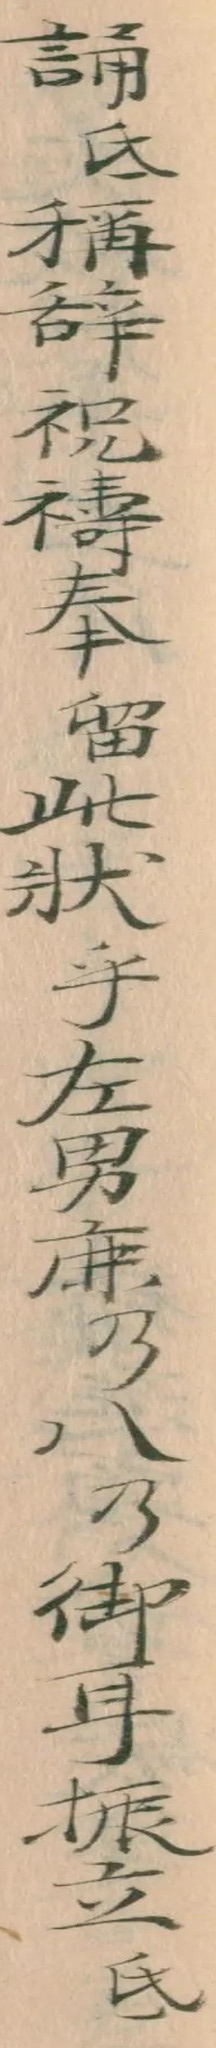誦氐称辞祝祷奉留此状乎左男鹿乃八乃御耳振立氐
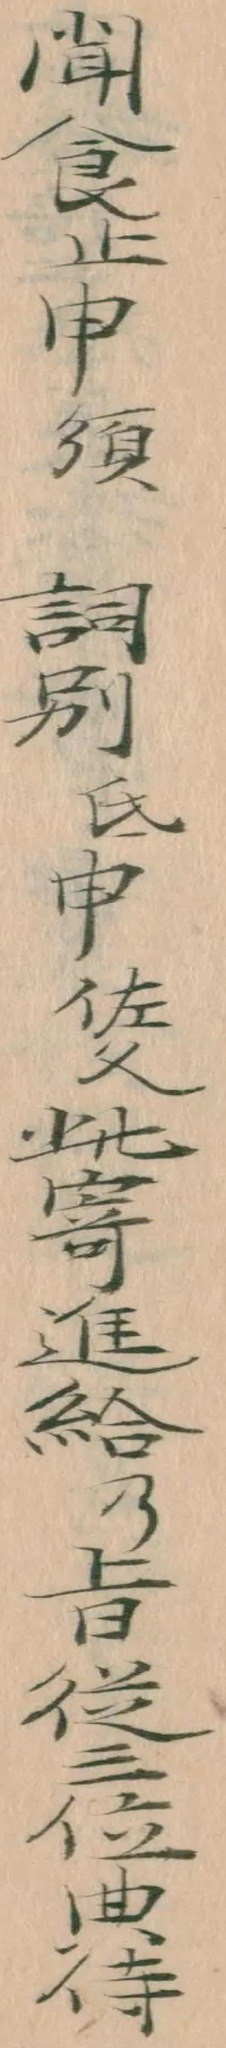聞食止申須詞別氐申佐久此寄進給乃旨従三位曲侍
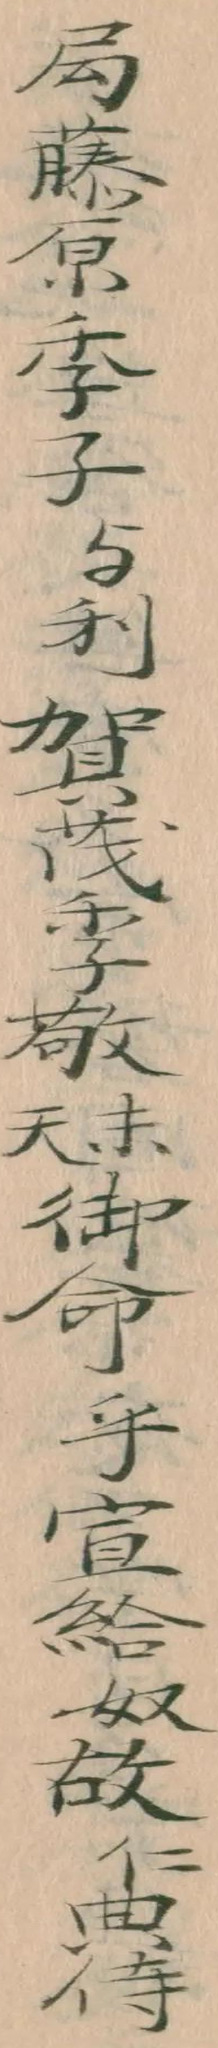局藤原季子与利賀茂季敬未天御命乎宣給奴故仁曲侍
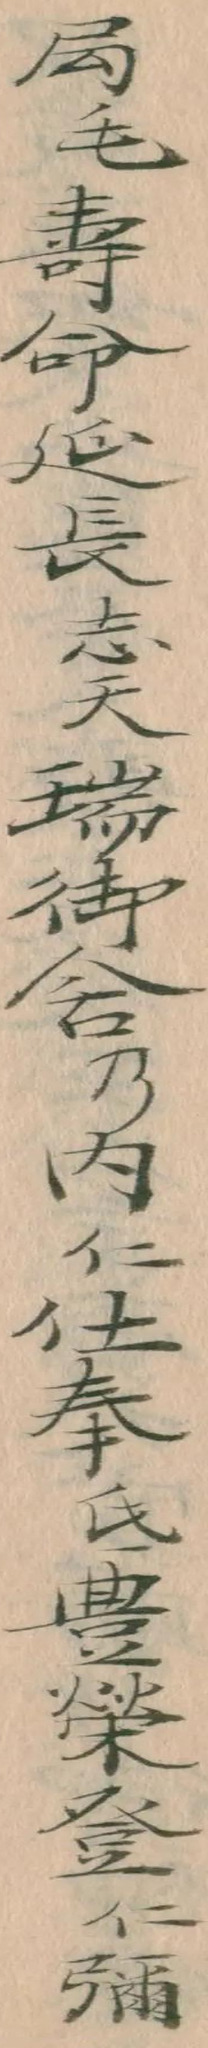局毛壽命延長志天瑞御合乃内仁仕奉氐豊榮登仁彌
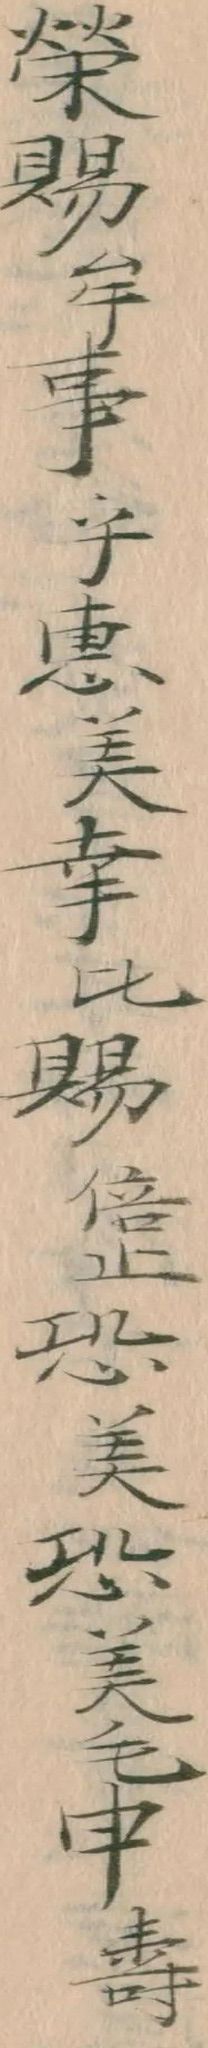榮賜牟事乎恵美幸比賜倍止恐美恐美毛申壽
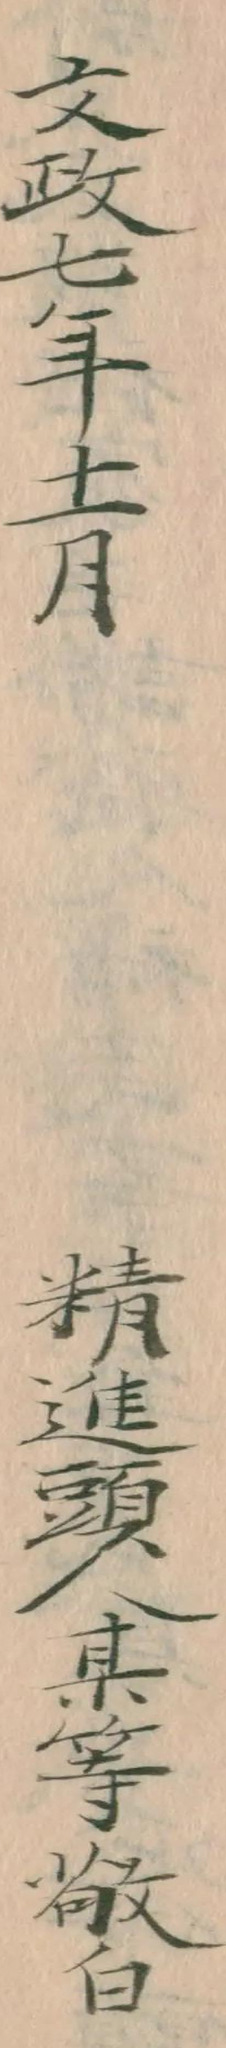文政七年十一月精進頭人某等敬白
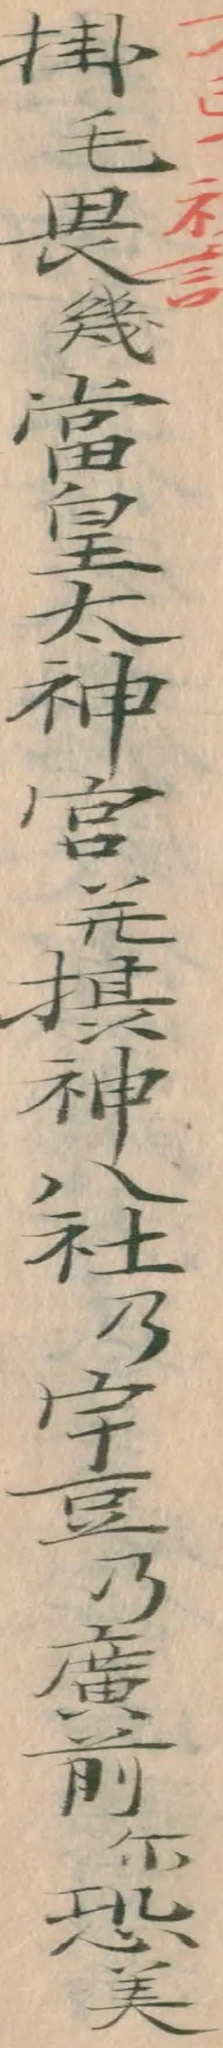掛毛畏幾當皇太神宮并摂神八社乃宇豆乃廣前尓恐美
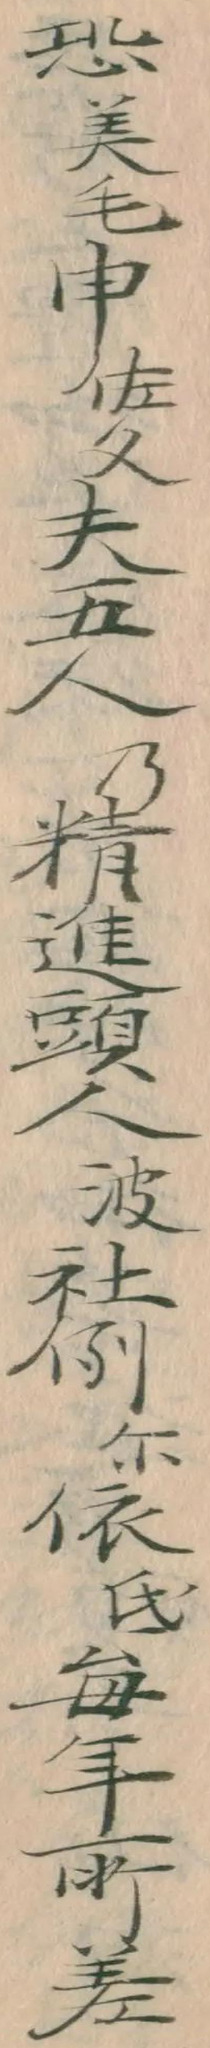恐美毛申佐久夫五人乃精進頭人波社例尓依氐毎年所差
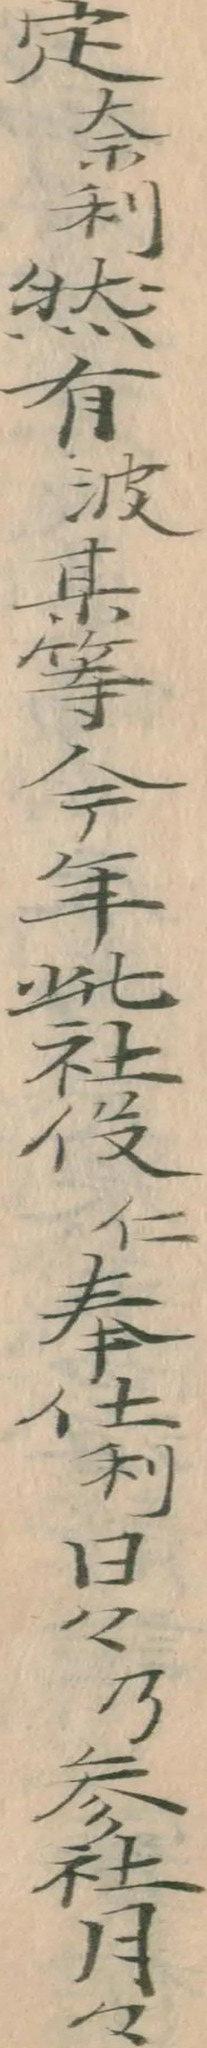定奈利然有波某等今年此社役仁奉仕利日々乃参社月々

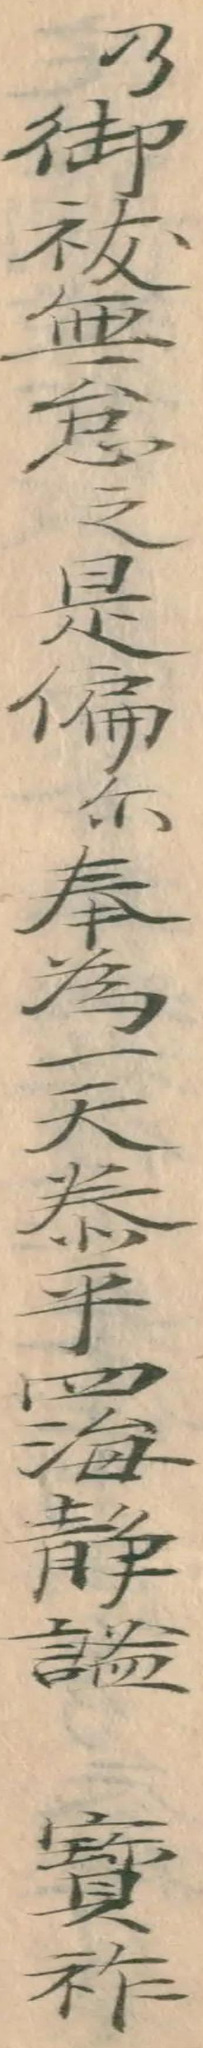乃御祓無怠之是偏尓奉為一天泰平四海静謐寶祚
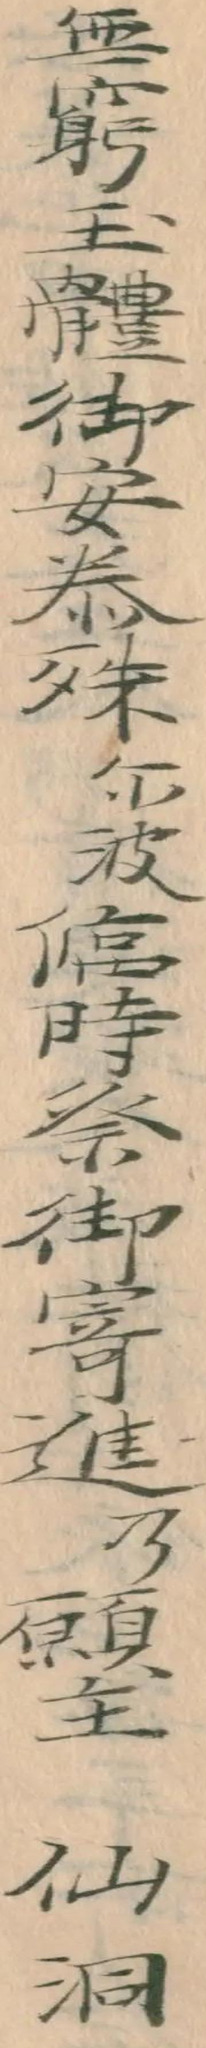無窮玉體御安泰殊尓波臨時祭御寄進乃願主仙洞
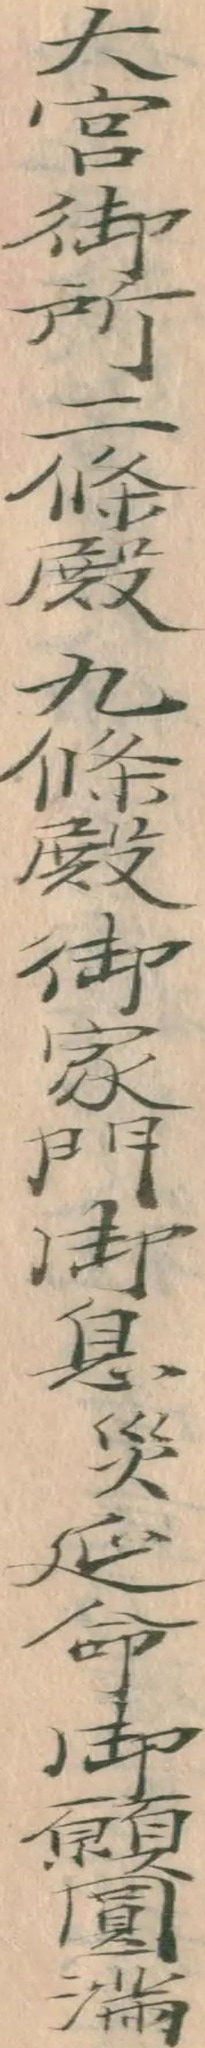大宮御所二條殿九條殿御家門御息災延命御願圓満
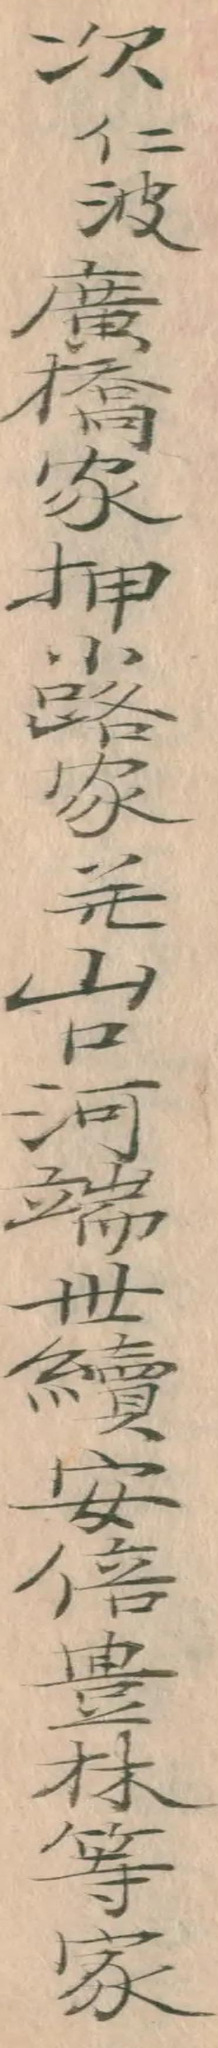次仁波廣橋家押小路家并山口河端世續安倍豊林等家
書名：賀茂社記録. 第74冊
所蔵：国立国会図書館 National Diet Library, JAPAN
